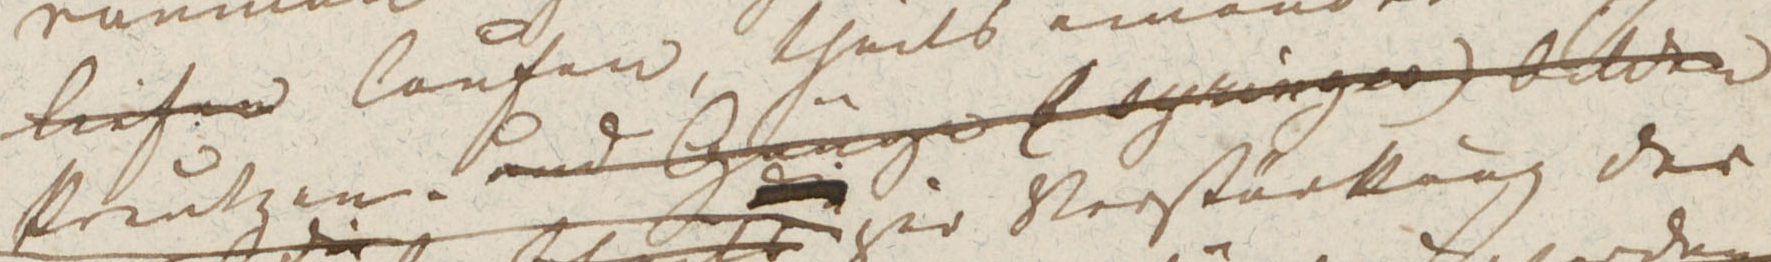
kreutzen. und Gänge (syringer) bilden
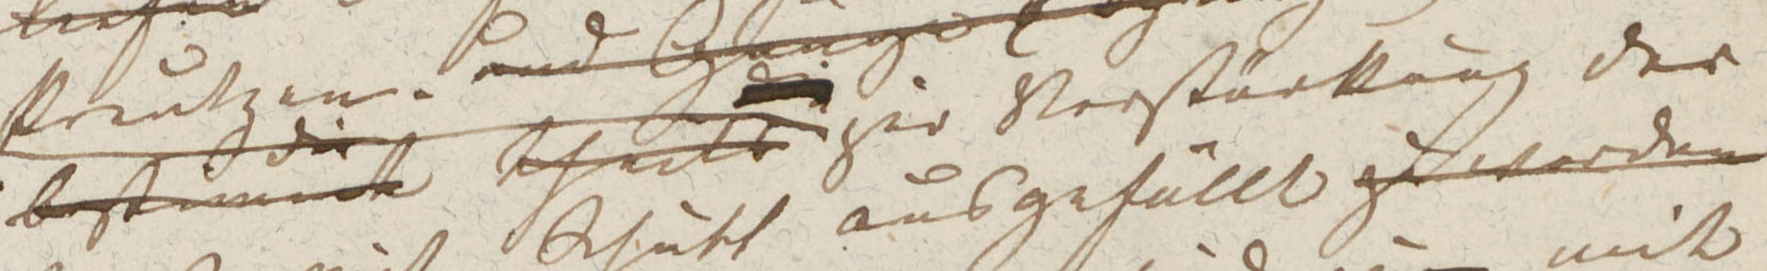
bestimmt die theils die zur Verstärkung der
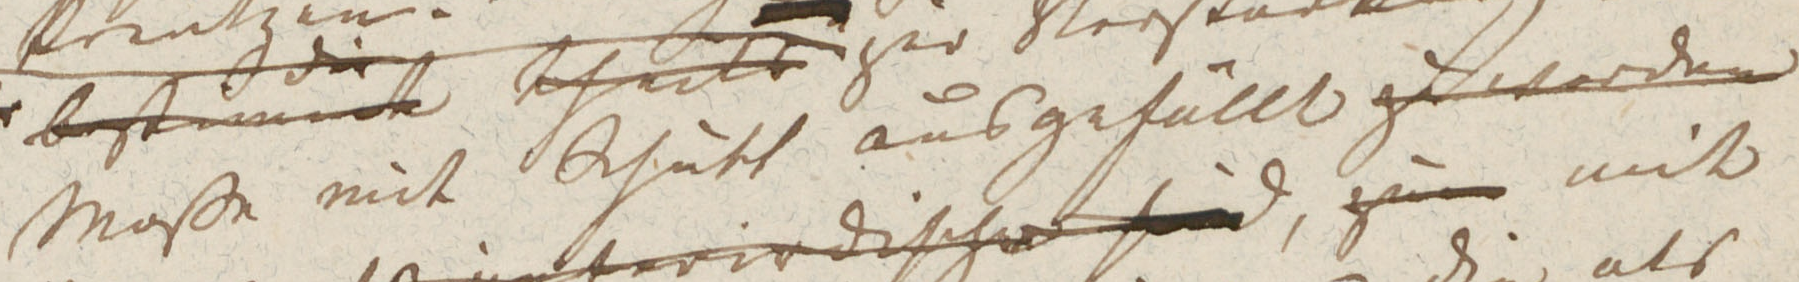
Masse mit Schutt ausgefüllt zu werden
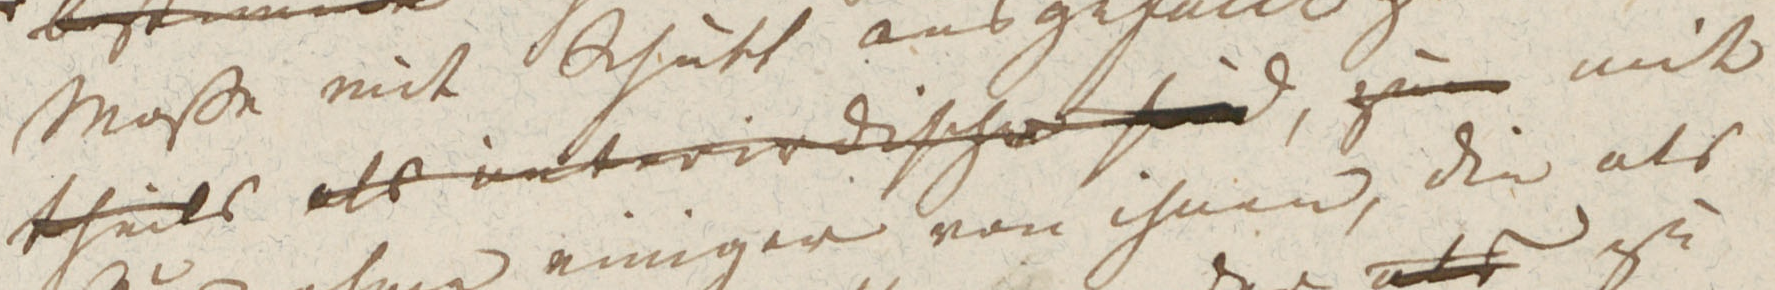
theils als unterirdische sind, zu mit
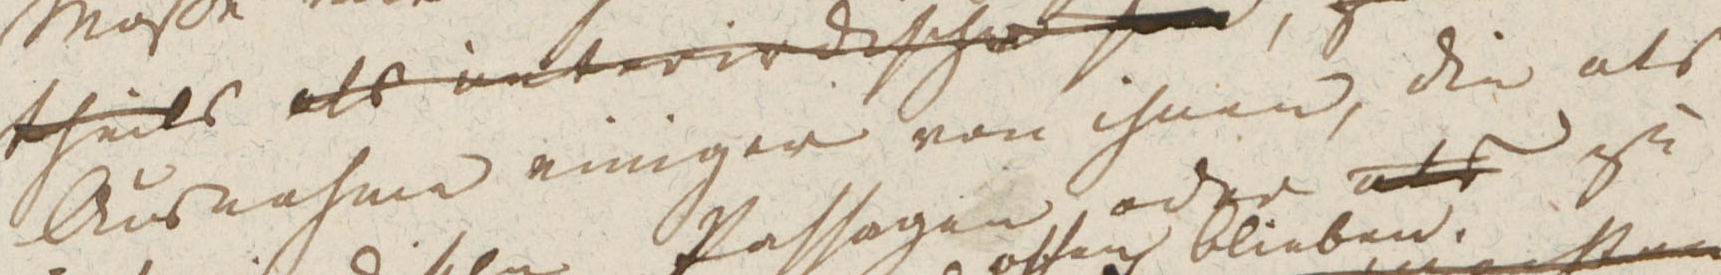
Ausnahme einiger von ihnen, die als
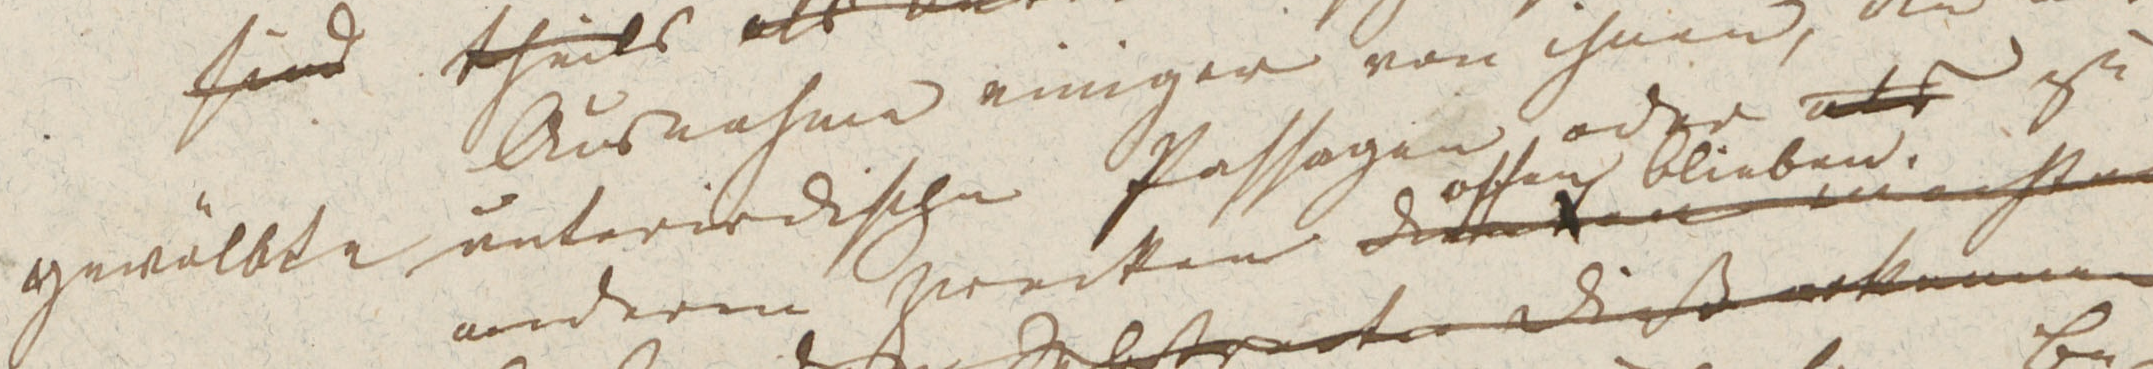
gewölbte unterirdische Passagen oder als zu
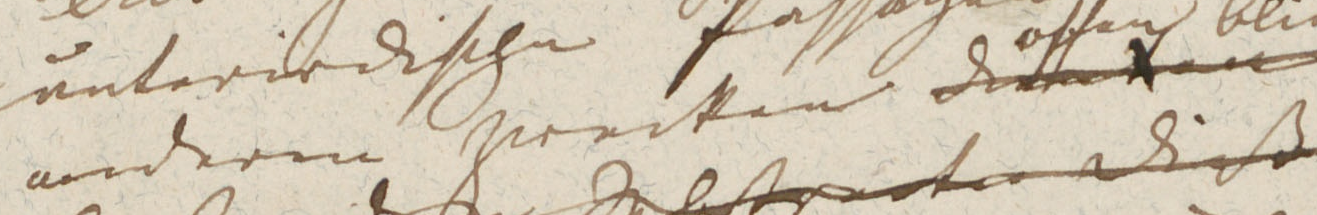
anderen Zwecken dienten mochten.
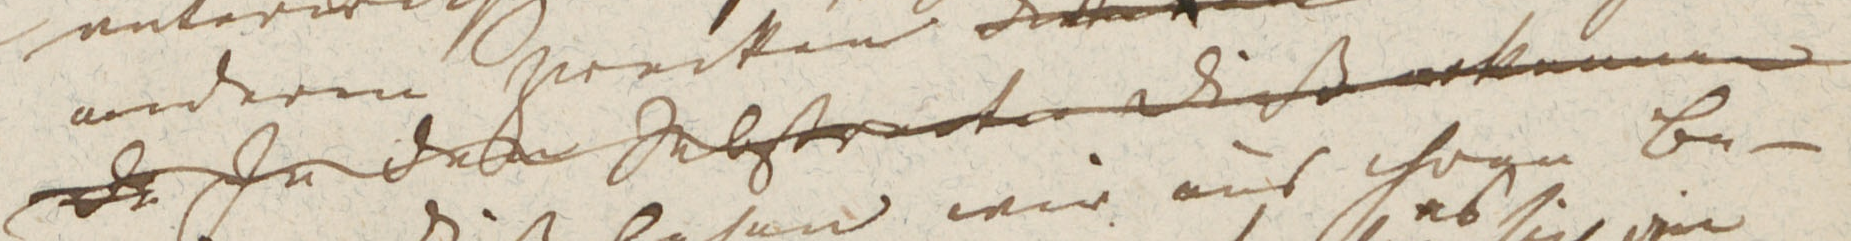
Di In den Substract Diess erkennen
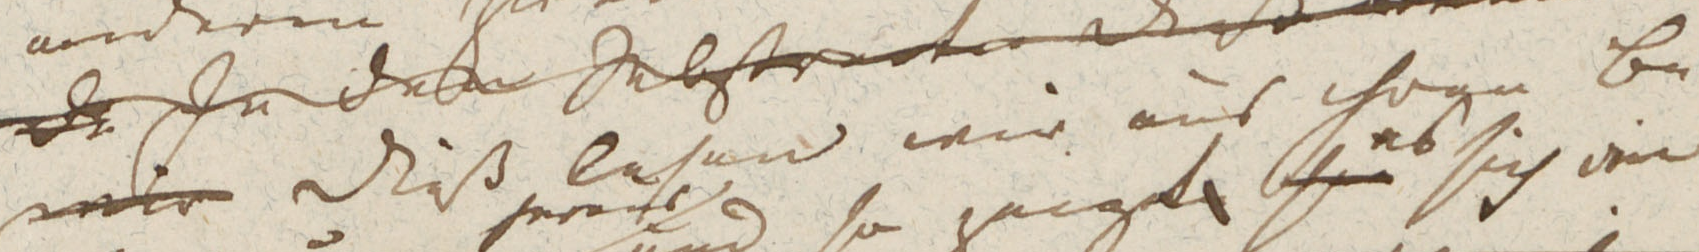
wir Diess lesen wir aus ihren Be-
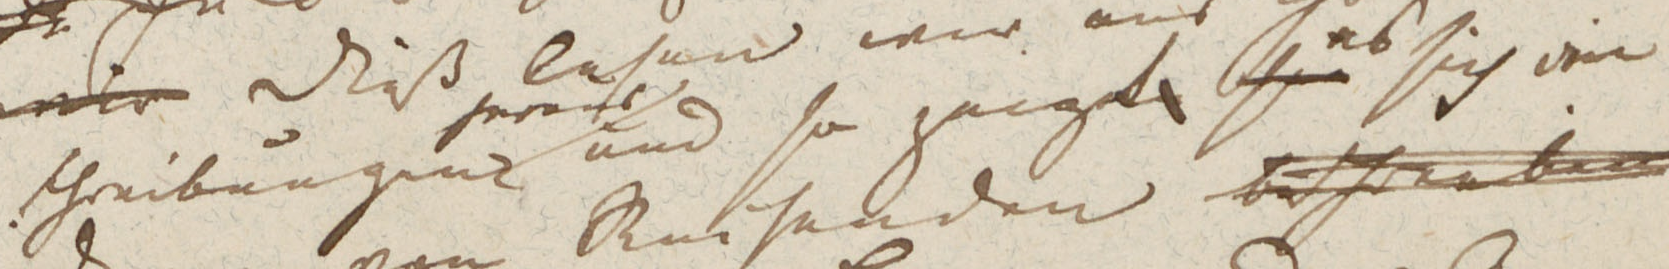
schreibungen heraus und so zeigte sie es sich an
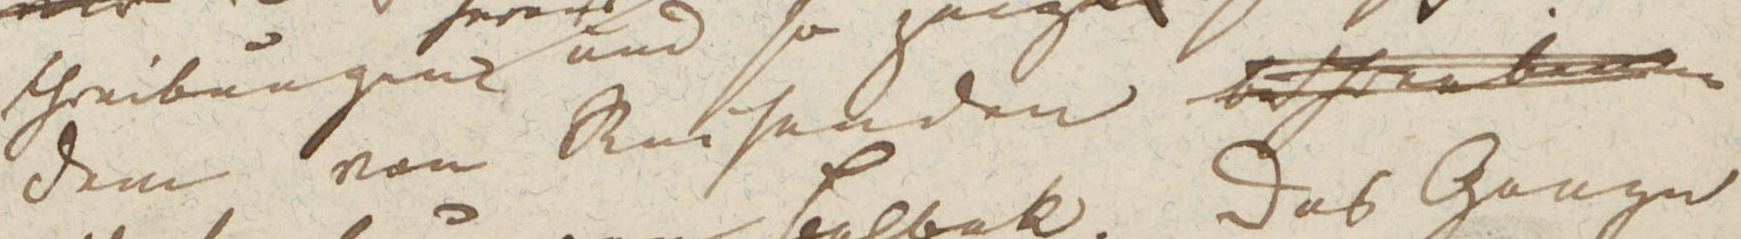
dem von Reisenden beschriebenen
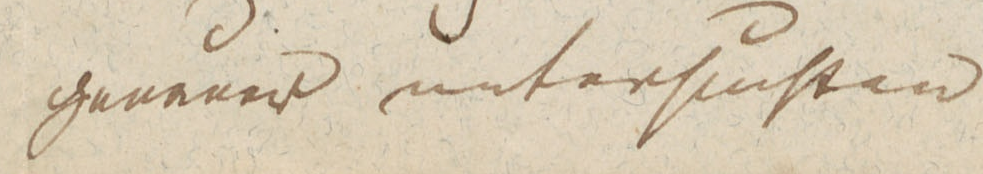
genauer untersuchten
